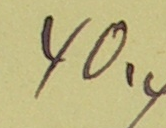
40
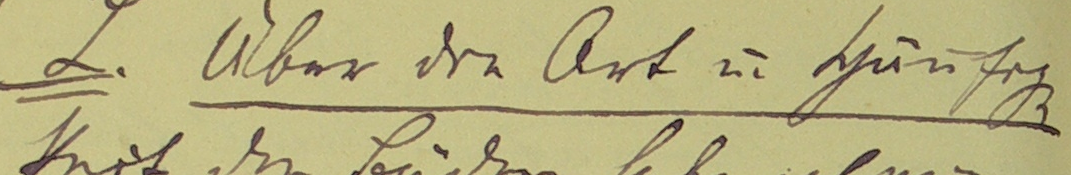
Über die Art und Häufig¬
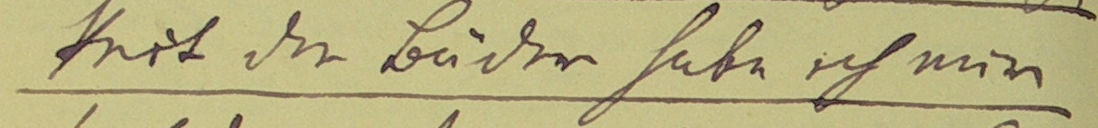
keit der Bäder habe ich mir
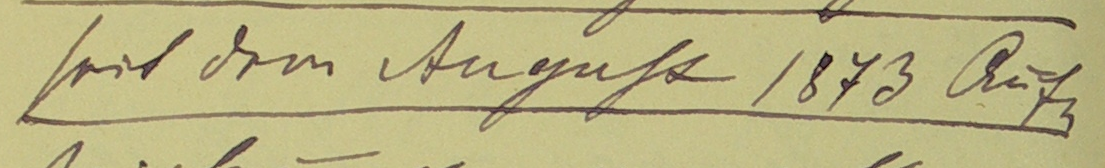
seit dem August 1873 Auf¬
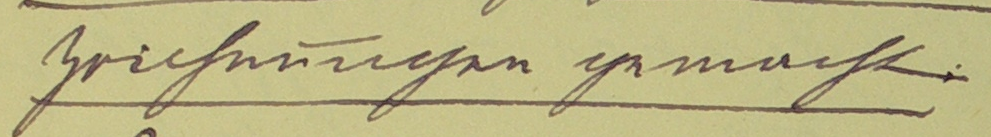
zeichnungen gemacht:
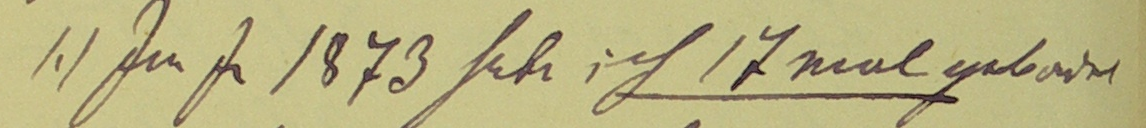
1.) Im Jahr 1873 = habe ich = 17 mal gebadet
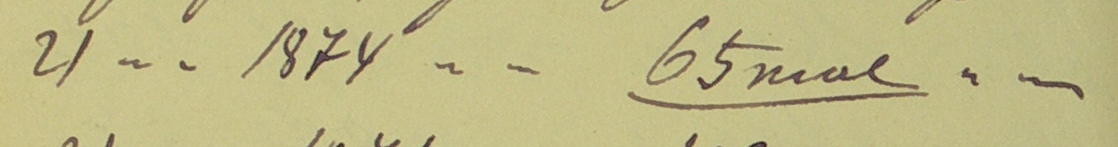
2.) 1874 = * = 65 * *
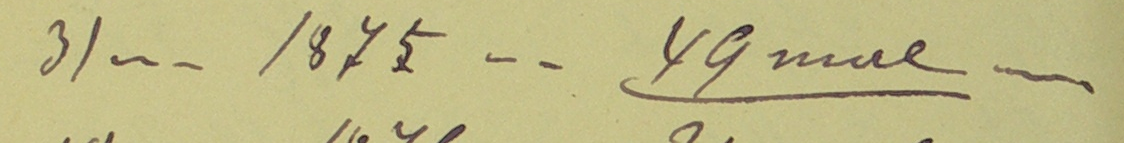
3.) 1875 = * = 49 * *
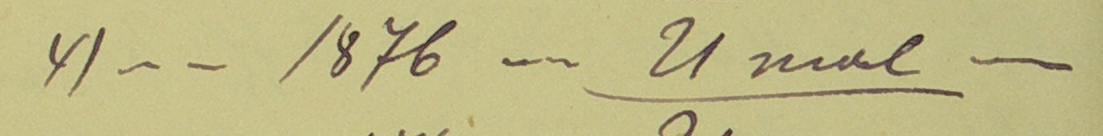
4.) 1876 = * = 21 * *
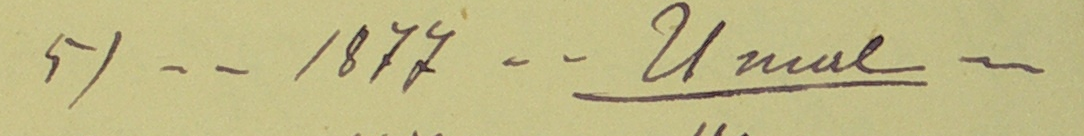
5.) 1877 = * = 21 * *
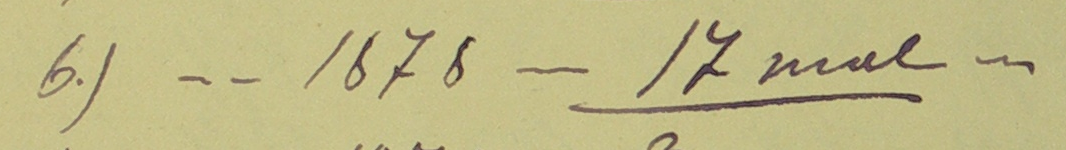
6.) 1878 = * = 17 * *
